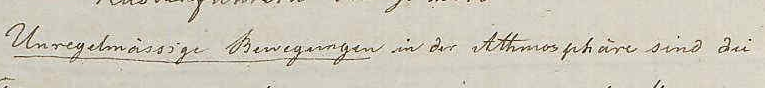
Unregelmässige Bewegungen in der Athmosphäre sind die
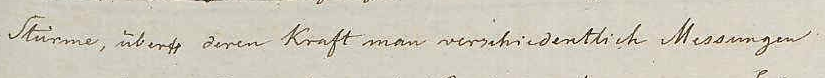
Stürme, über deren Kraft man verschiedentlich Messungen
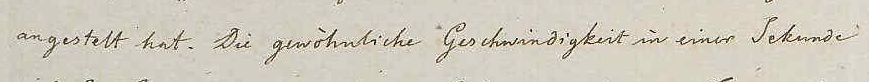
angestelt hat. Die gewöhnliche Geschwindigkeit in einer Sekunde
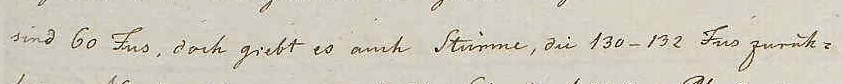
sind 60 Fus, doch giebt es auch Stürme, die 130–132 Fus zurük-
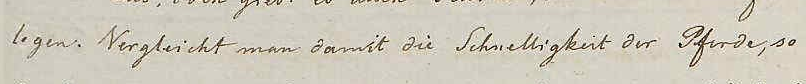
legen. Vergleicht man damit die Schnelligkeit der Pferde, so
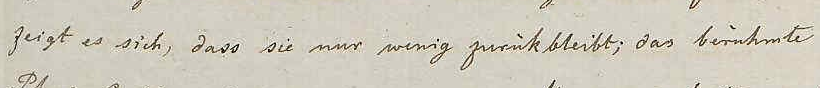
zeigt es sich, dass sie nur wenig zurükbleibt; das berühmte
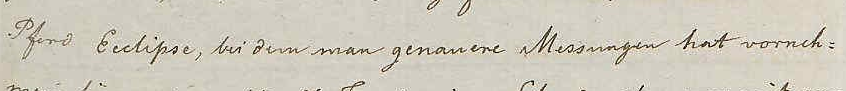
Pferd Ecclipse, bei dem man genauere Messungen hat vorneh-
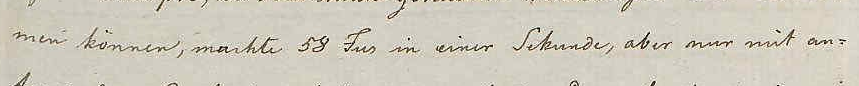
men können, machte 58 Fus in einer Sekunde, aber nur mit an-
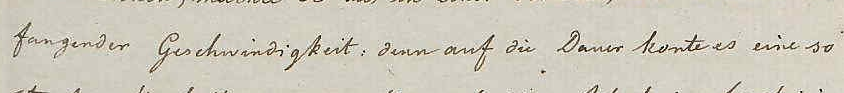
fangender Geschwindigkeit: denn auf die Dauer konte es eine so
